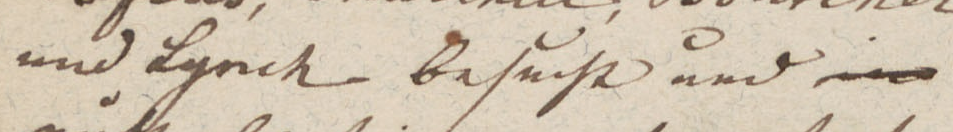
und Lynch besucht und in
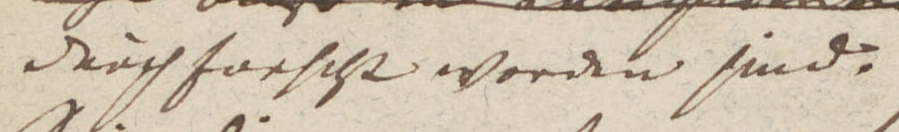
durchforscht worden sind.
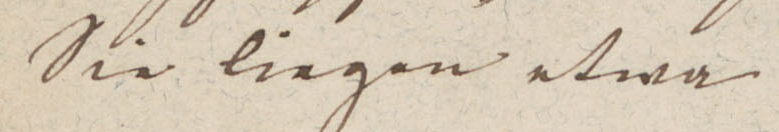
Sie liegen etwa
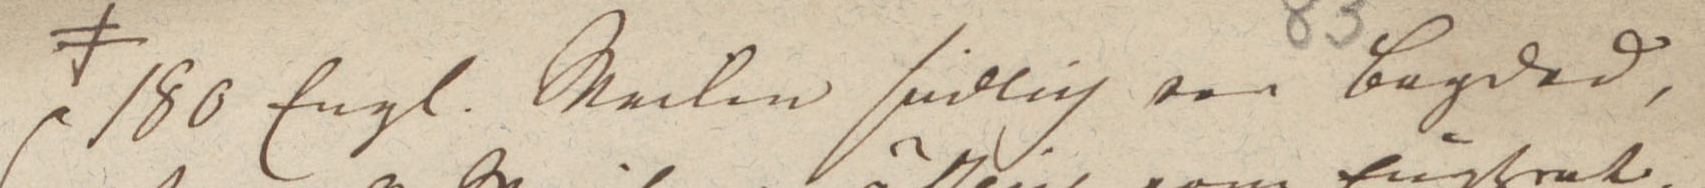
180 Engl. Meilen südlich von Bagdad,
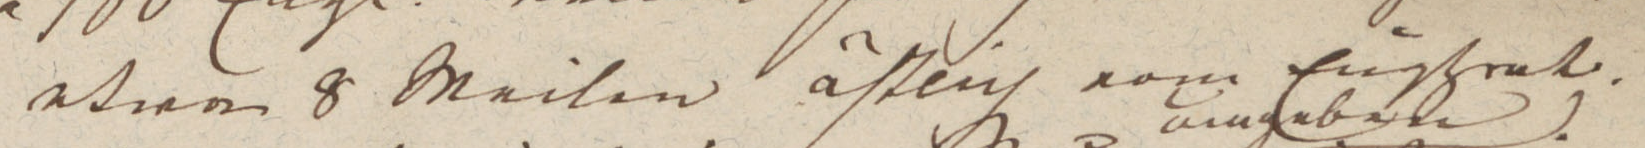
etwa 8 Meilen östlich vom Euphrat.
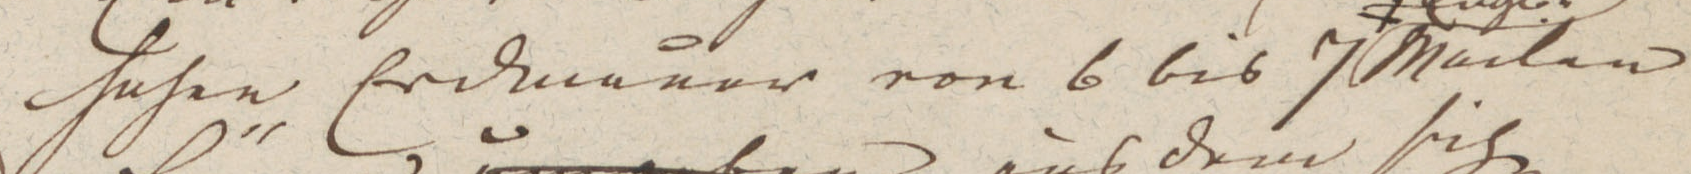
hohen Erdmauer von 6 bis 7 %Engl. Meilen
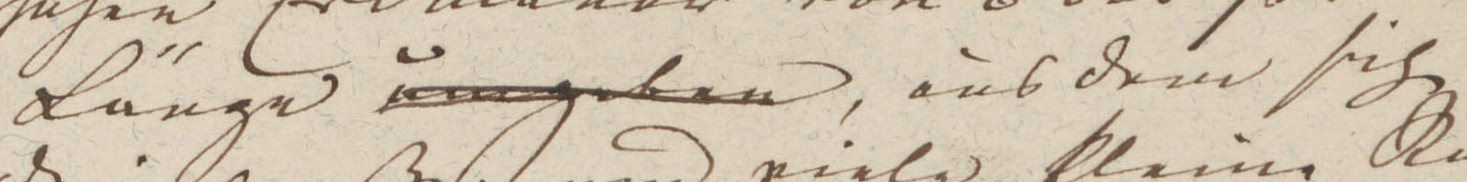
Länge umgeben, aus dem sich
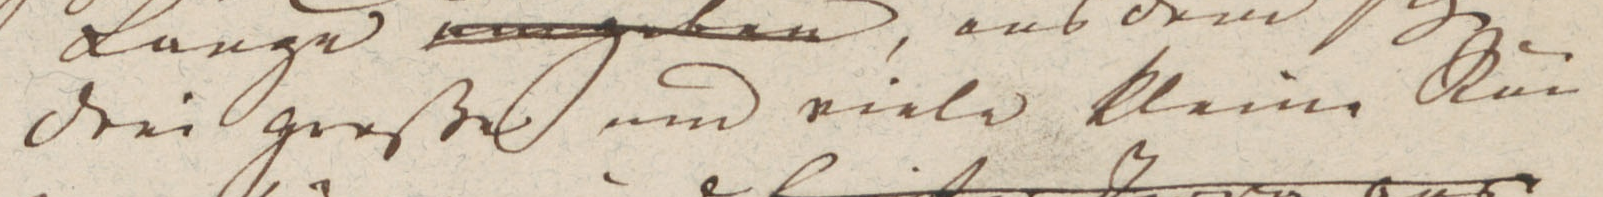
drei grosse und viele kleine Rui-
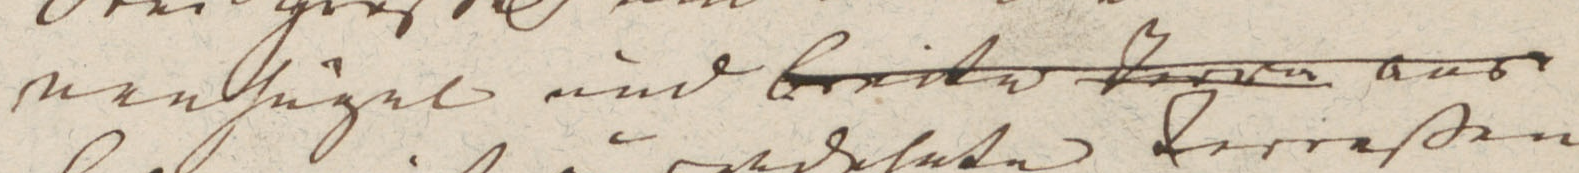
nenhügel und breite Terra aus
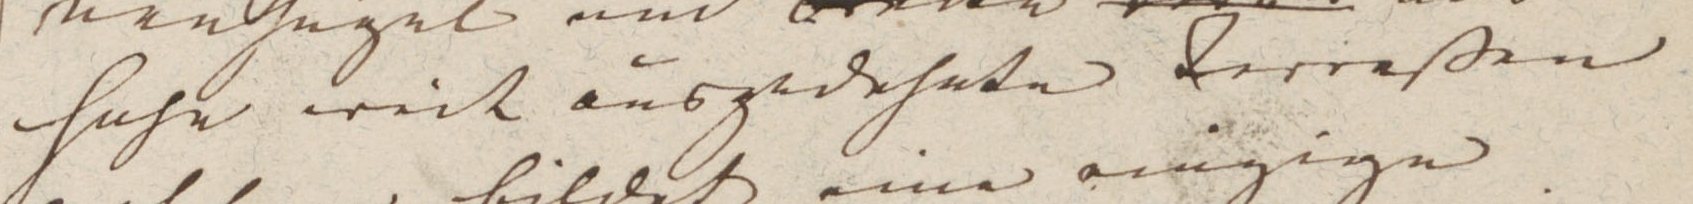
hohe weit ausgedehnte Terrassen
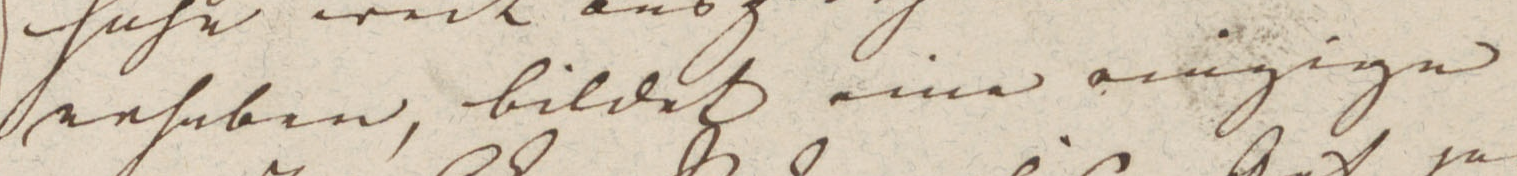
erheben, bildet eine einzige
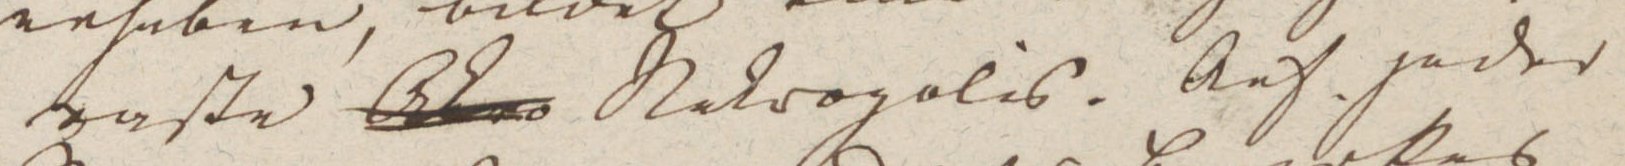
vaste Akro Nekropolis. Auf jeder
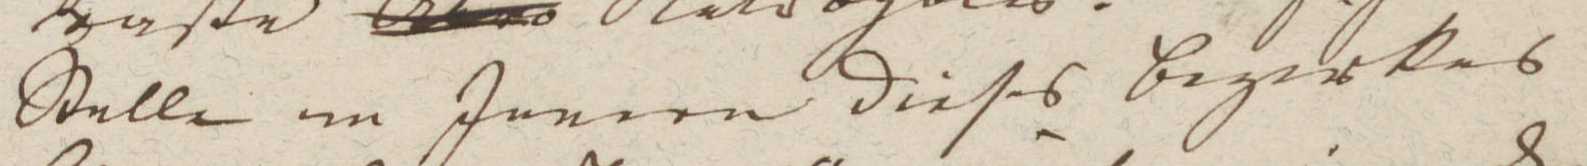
Stelle im Innern dieses Bezirkes
